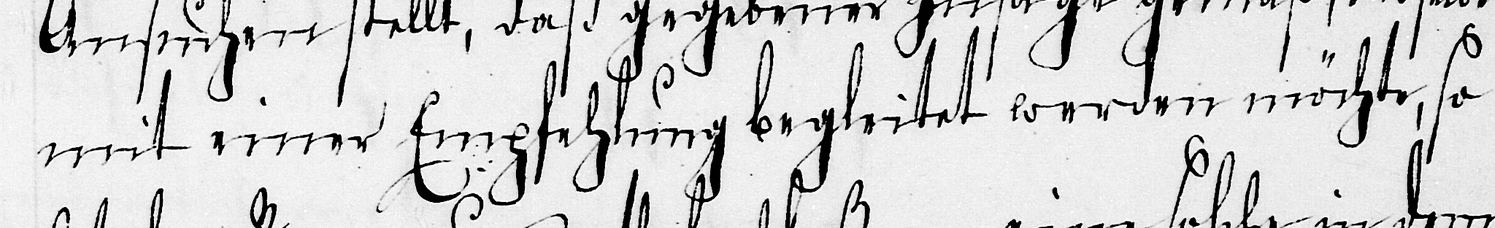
mit einer Empfehlung begleitet werden möchte, so
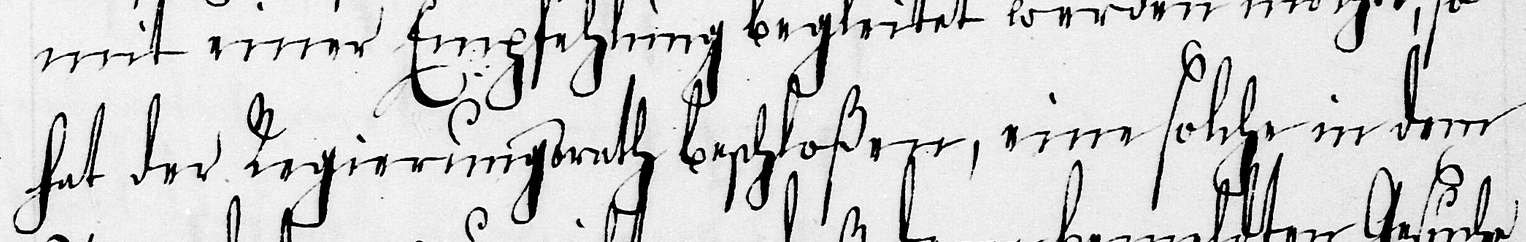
hat der Regierungsrath beschloßen, eine solche in dem
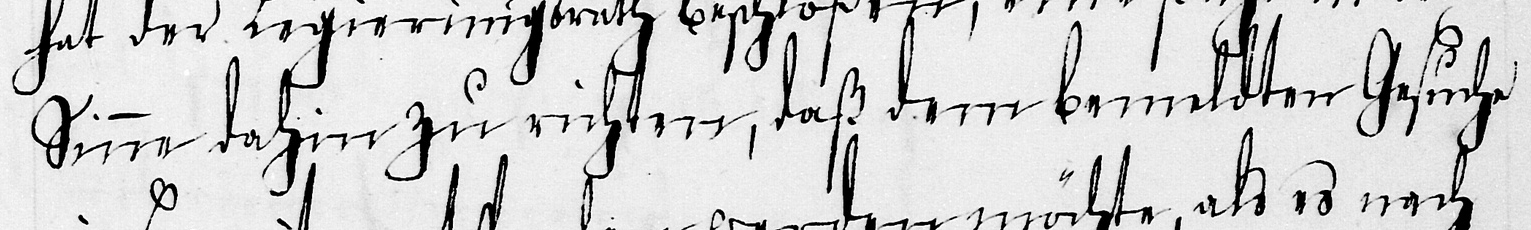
Sinne dahin zu richten, daß dem bemeldten Gesuche
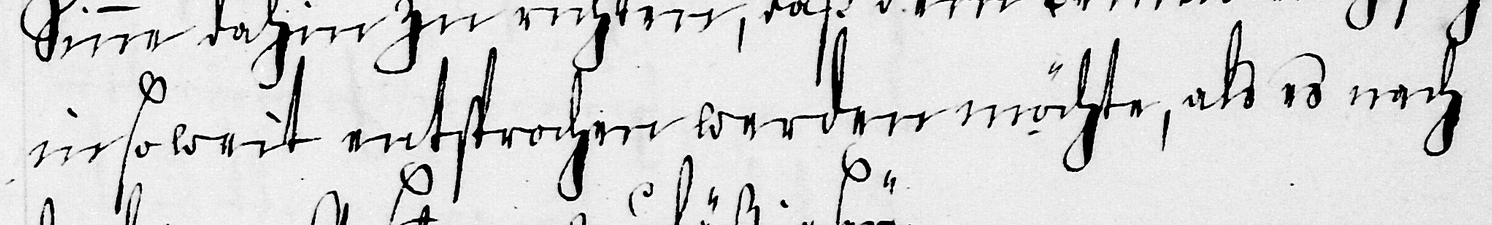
insoweit entsprochen werden möchte, als es nach
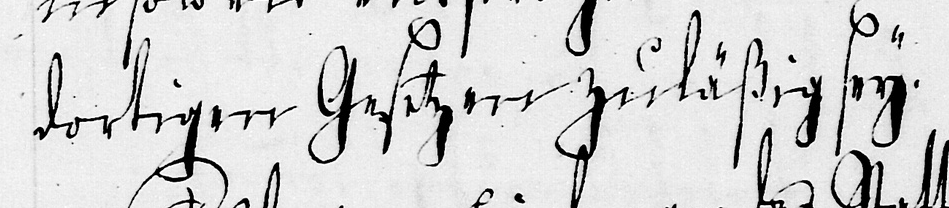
dortigen Gesetzen zuläßig sey.
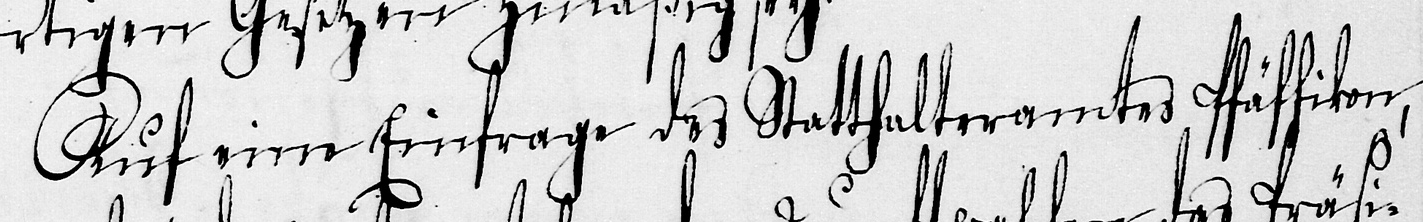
Auf eine Einfrage des Statthalteramtes Pfäffikon,
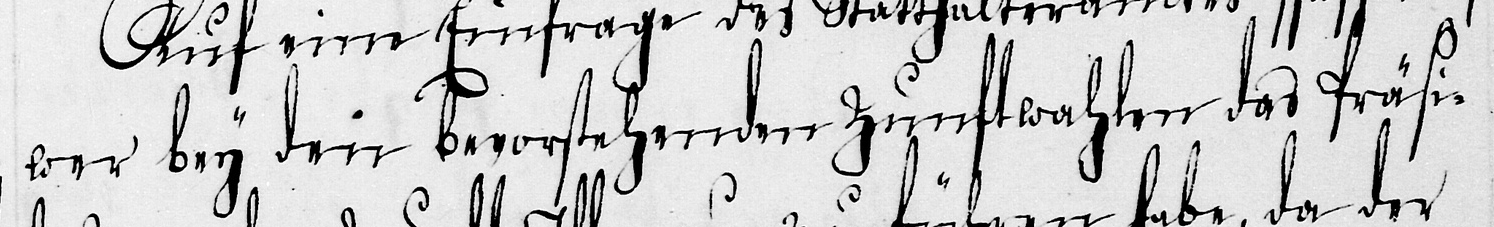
wer bey den bevorstehenden Zunftwahlen das Präsi¬
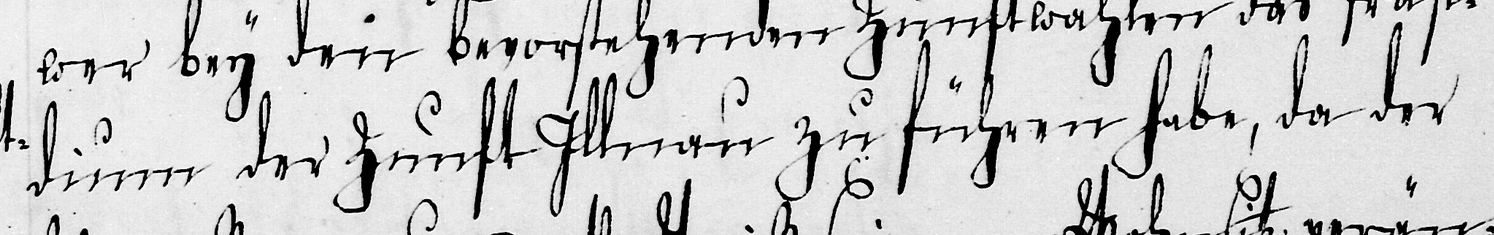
dium der Zunft Illnau zu führen habe, da der
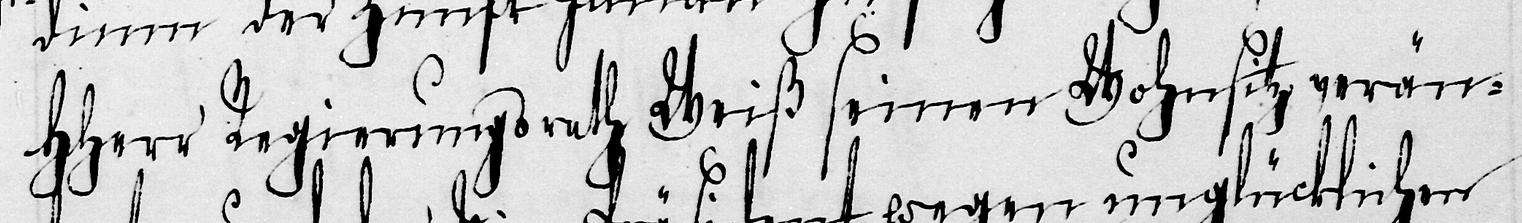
HHerr Regierungsrath Weiß seinen Wohnsitz verän¬
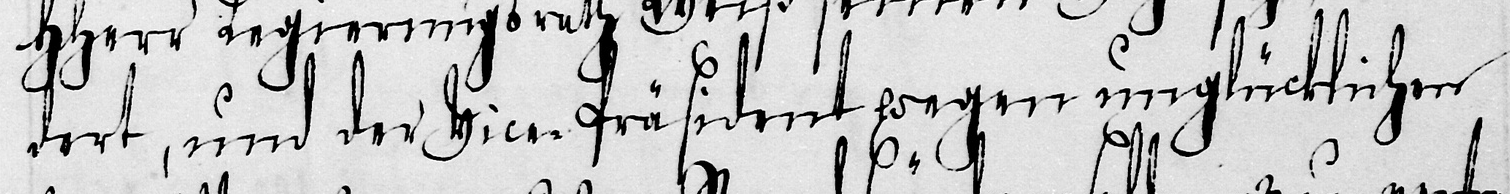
dert, und der Vice-Präsident wegen unglücklichen
